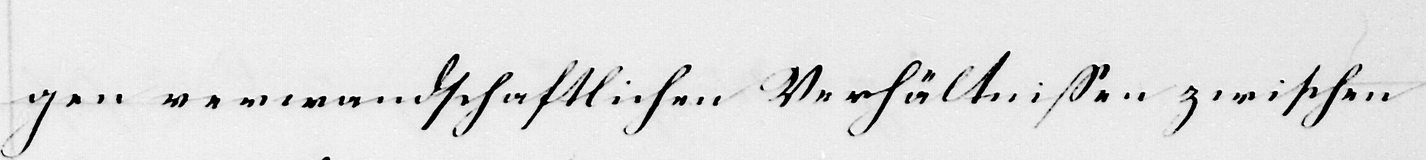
gen verwandschaftlichen Verhältnißen zwischen
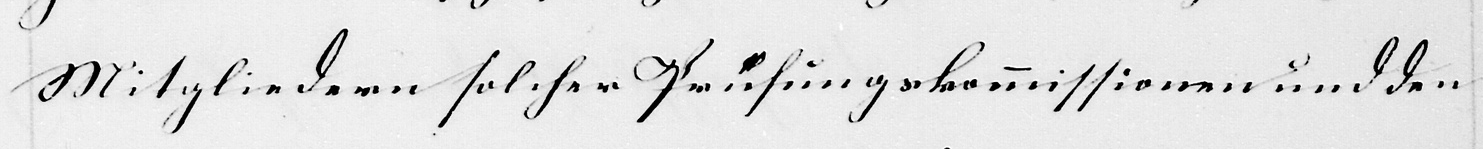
Mitgliedern solcher Prüfungskommissionen und den
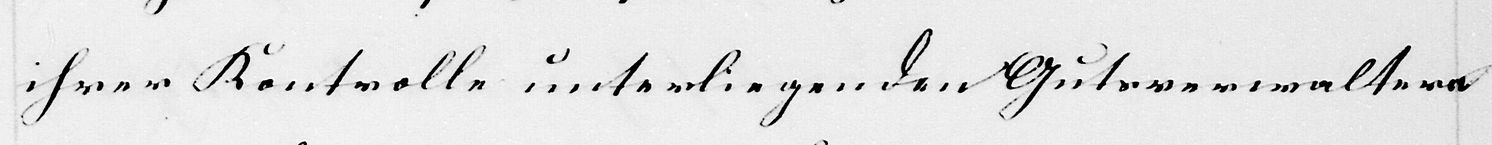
ihrer Kontrolle unterliegenden Gutsverwaltern
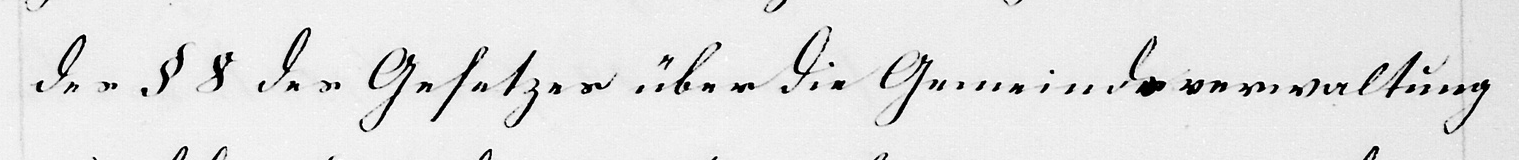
des § 8 des Gesetzes über die Gemeind[?e]verwaltung
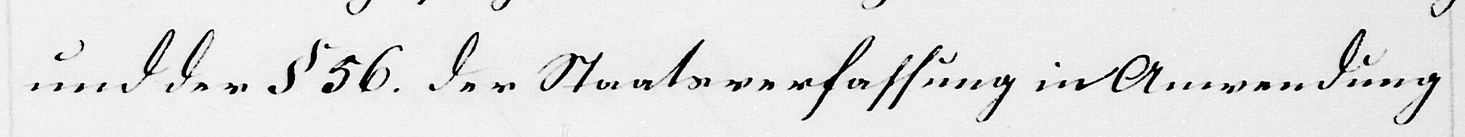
und der § 56. der Staatsverfassung in Anwendung
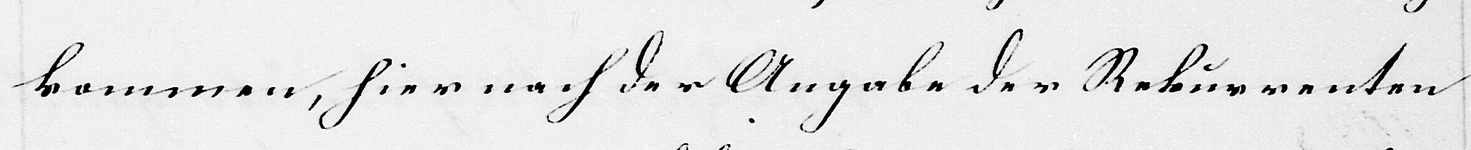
kommen, hier nach der Angabe der Rekurrenten
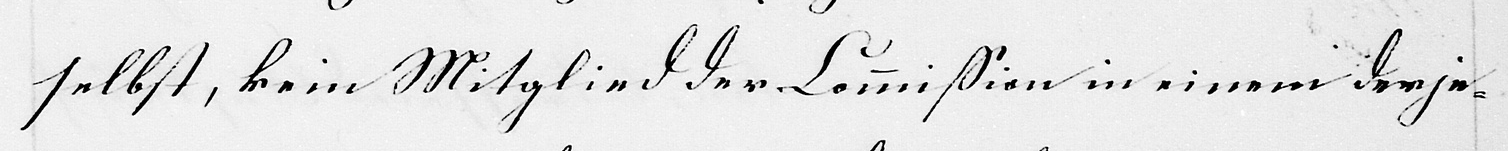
selbst, kein Mitglied der Commißion in einem derje¬
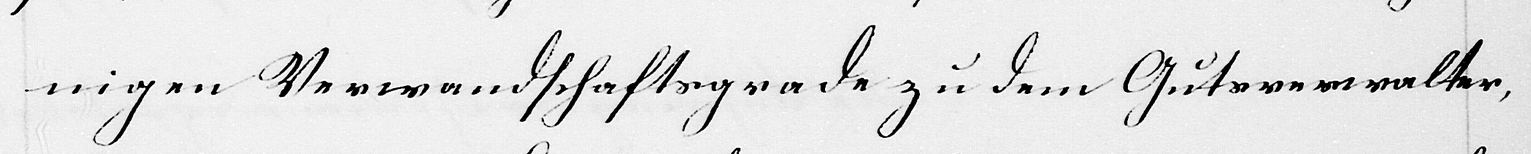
nigen Verwandschaftsgrade zu dem Gutsverwalter,
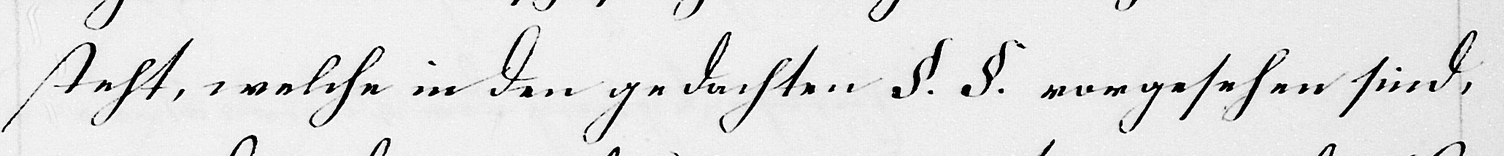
steht, welche in den gedachten §. §. vorgesehen sind,
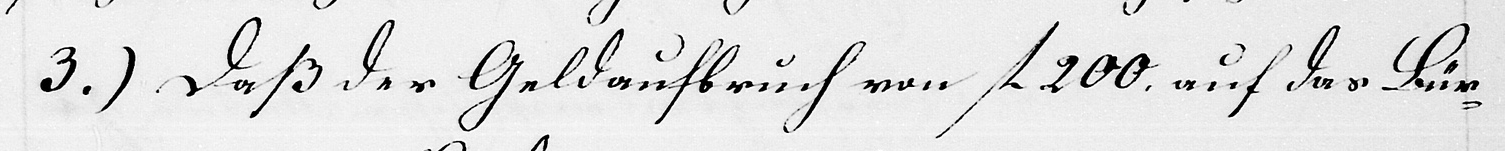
3.) Daß der Geldaufbruch von fl 200. auf das Bür¬
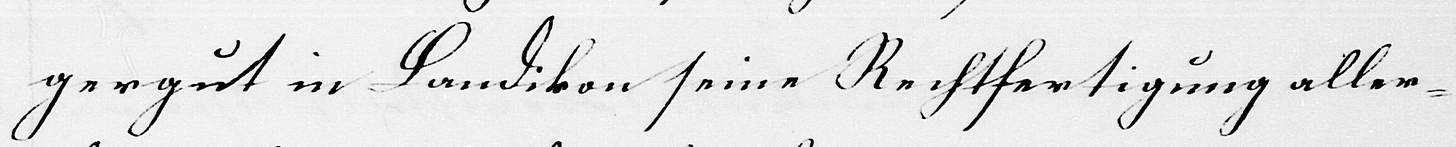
gergut in Landikon seine Rechtfertigung aller¬
